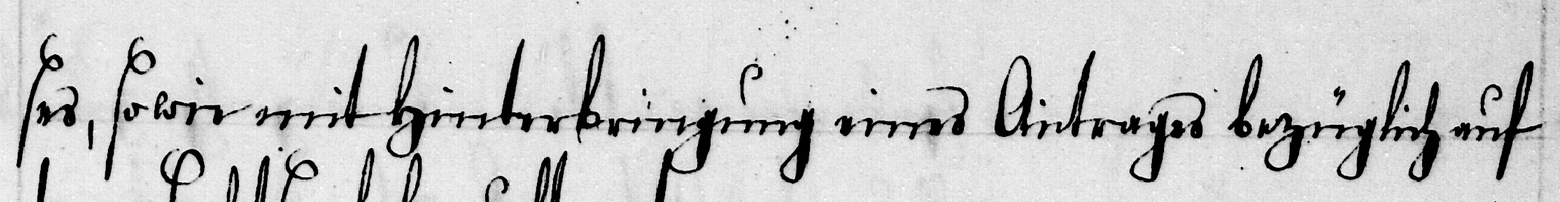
ses, sowie mit Hinterbringung eines Antrages bezüglich auf
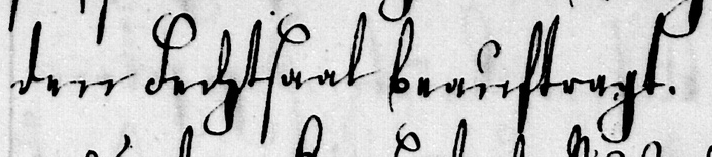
den Fechtsaal beauftragt.
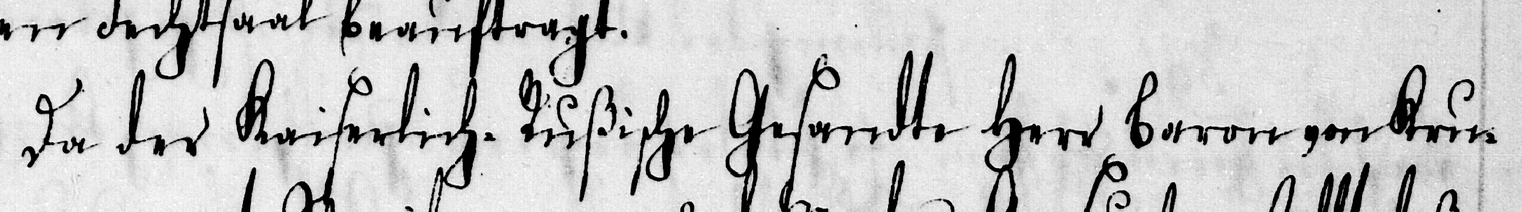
Da der Kaiserlich-Rußische Gesandte Herr Baron von Kru¬
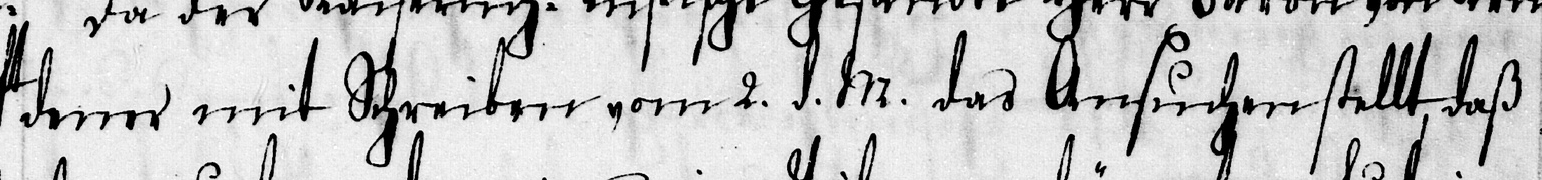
dener mit Schreiben vom 2. d. M. das Ansuchen stellt, daß
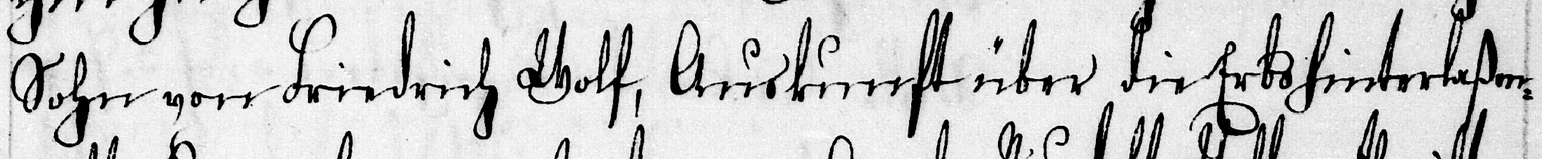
Sohn von Friedrich Wolf, Auskunft über die Erbshinterlaße¬
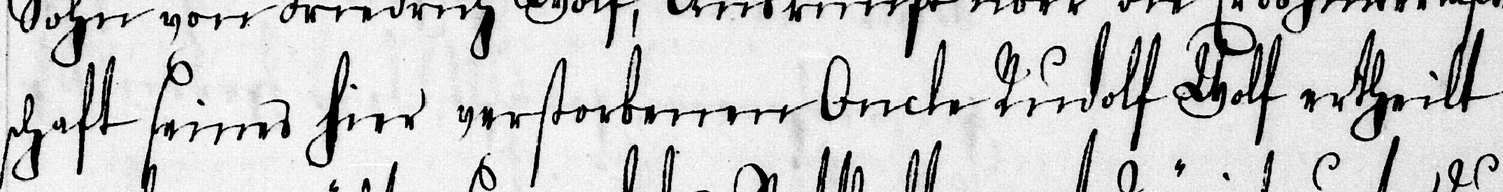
chaft seines hier verstorbenen Oncle Rudolf Wolf ertheilt
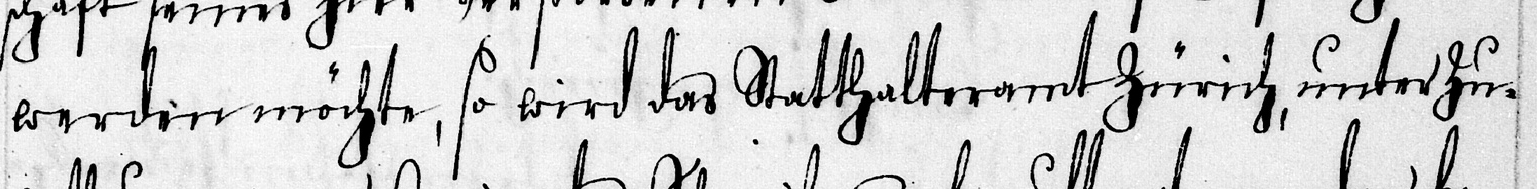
werden möchte, so wird das Statthalteramt Zürich, unter Zu¬
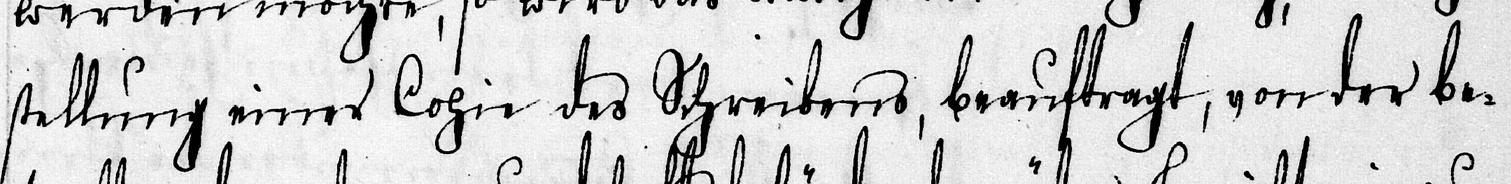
stellung einer Copie des Schreibens, beauftragt, von der be¬
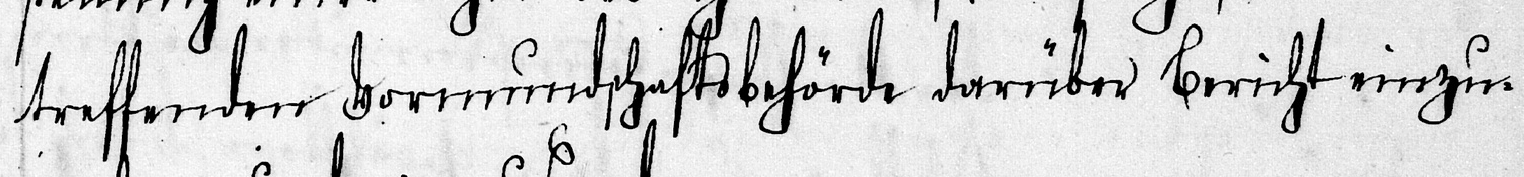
treffenden Vormundschaftsbehörde darüber Bericht einzu¬
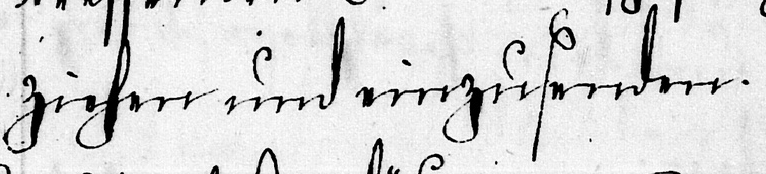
ziehen und einzusenden.
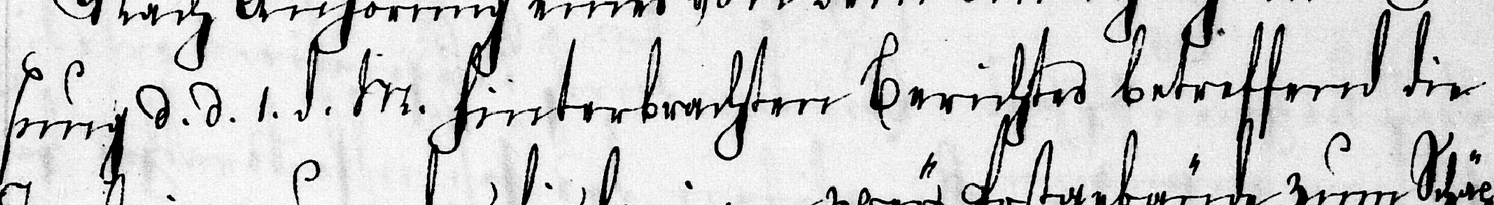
sung d. d. 1. d. M. hinterbrachten Berichtes betreffend die
